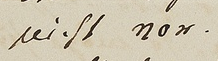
nicht vor.
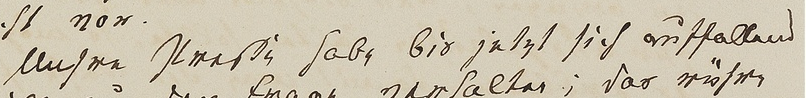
Unsre Presse habe bis jetzt sich auffallend
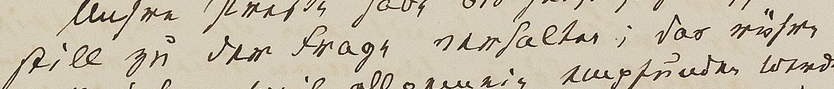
still zu der Frage verhalten; das rühre
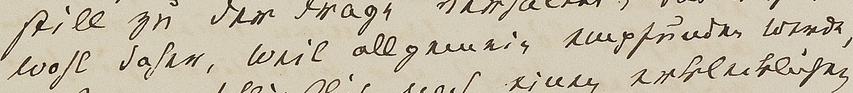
wohl daher, weil allgemein empfunden werde,
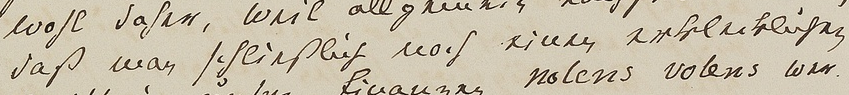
daß man schließlich noch einen erklecklichen
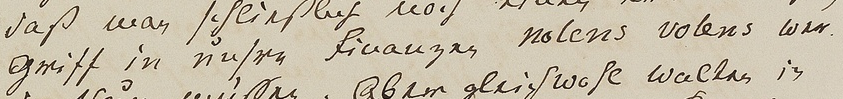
Griff in unsre Finanzen nolens volens wer-
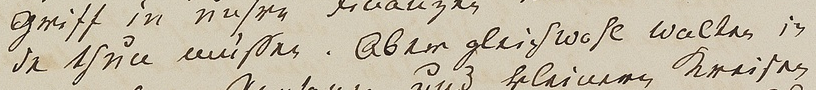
de thun müssen. Aber gleichwohl walten in
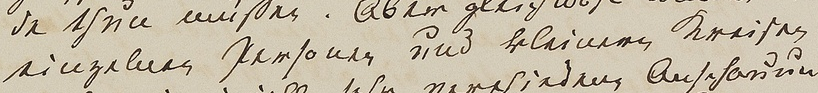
einzelnen Personen und kleinern Kreisen
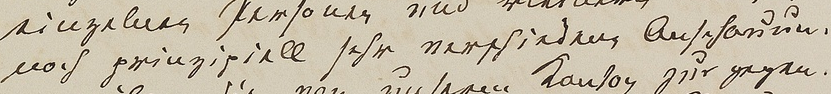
noch prinzipiell sehr verschiedene Anschauun-
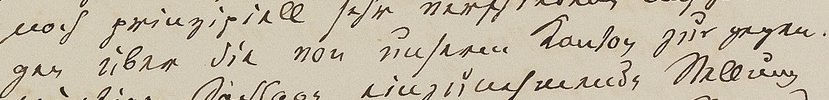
gen über die von unserm Kanton zur gegen-
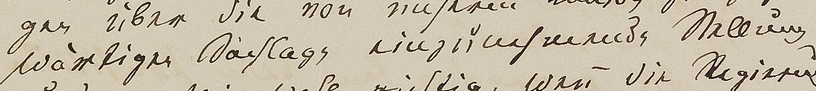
wärtigen Sachlage einzunehmende Stellung
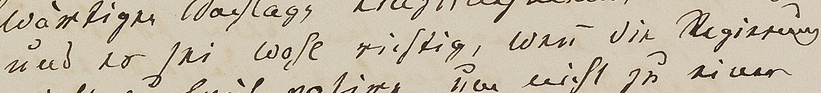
und es sei wohl richtig, wenn die Regierung
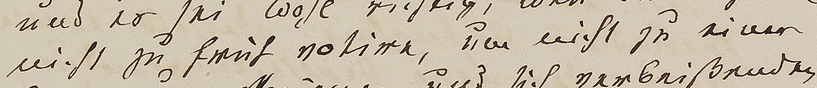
nicht zu früh votire, um nicht zu einer
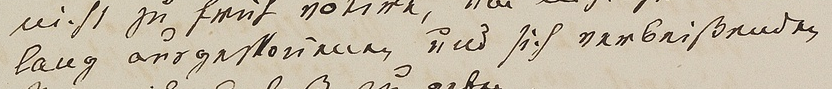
lang ausgesponnenen, und sich verbeißenden
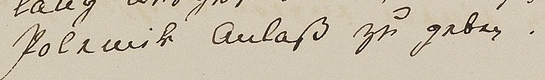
Polemik Anlaß zu geben.
